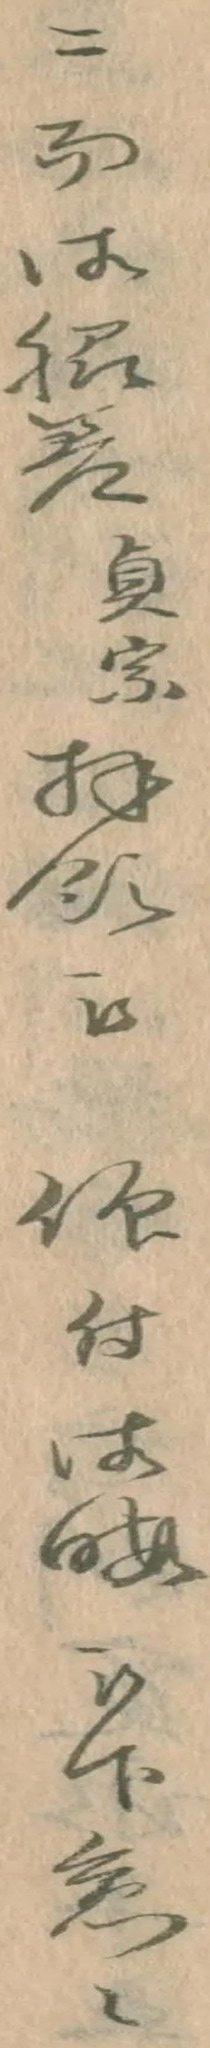に而御脇差貞宗拝領被仰付御暇被下急に
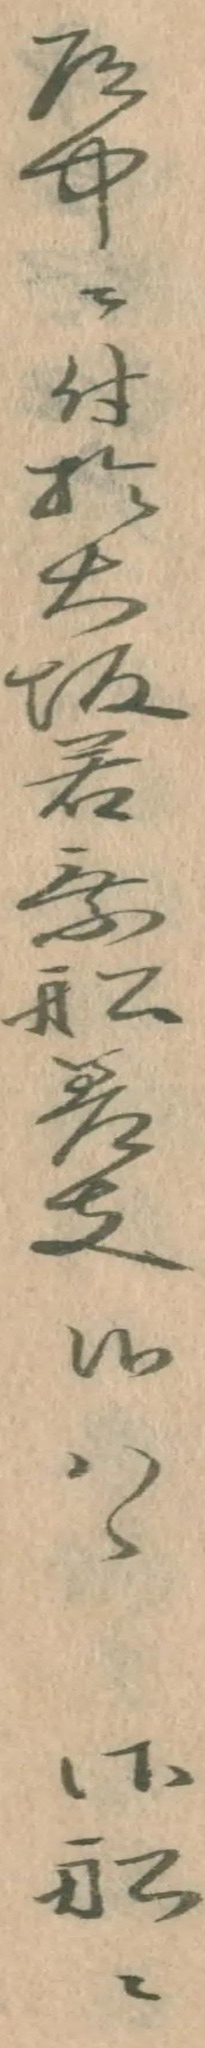道中に付於大坂若乗舩差支候はゝ御舩に
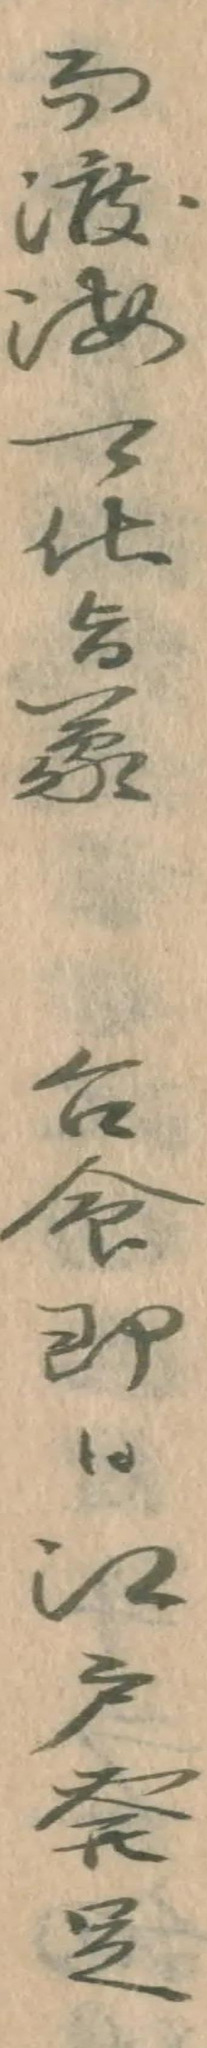而渡海可仕旨蒙召命即日江戸発足
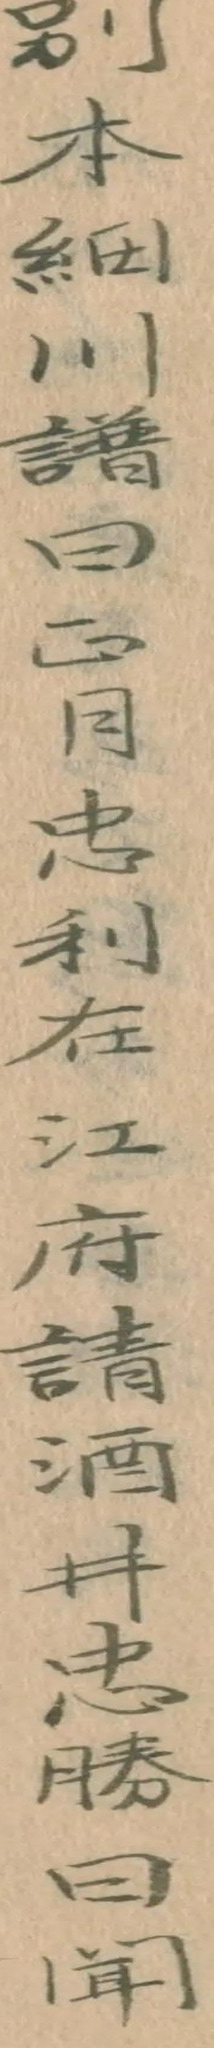別本細川譜曰正月忠利在江府請酒井忠勝曰聞
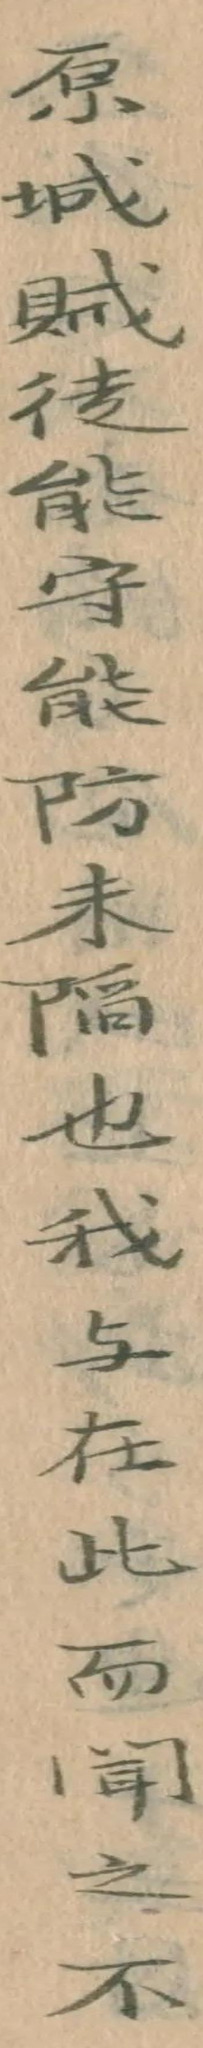原城賊徒能守能防未陷也我与在此而聞之不
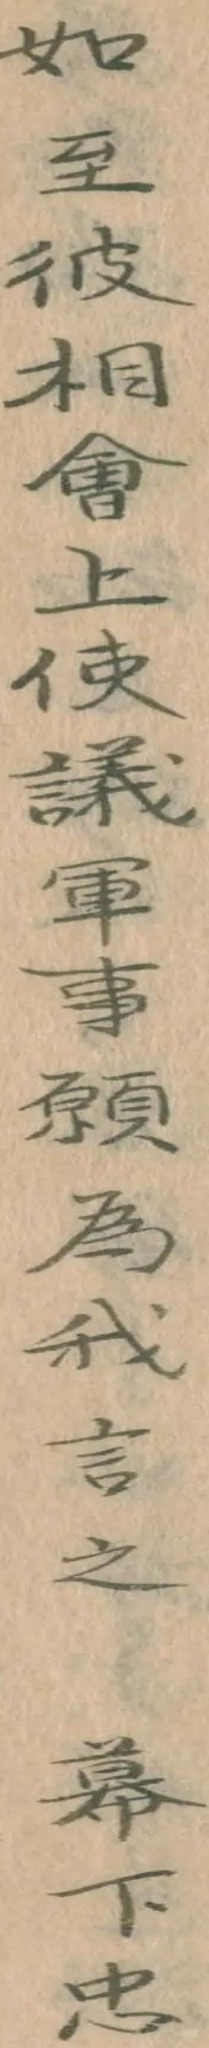如至彼相会上使議軍事願為我言之幕下忠
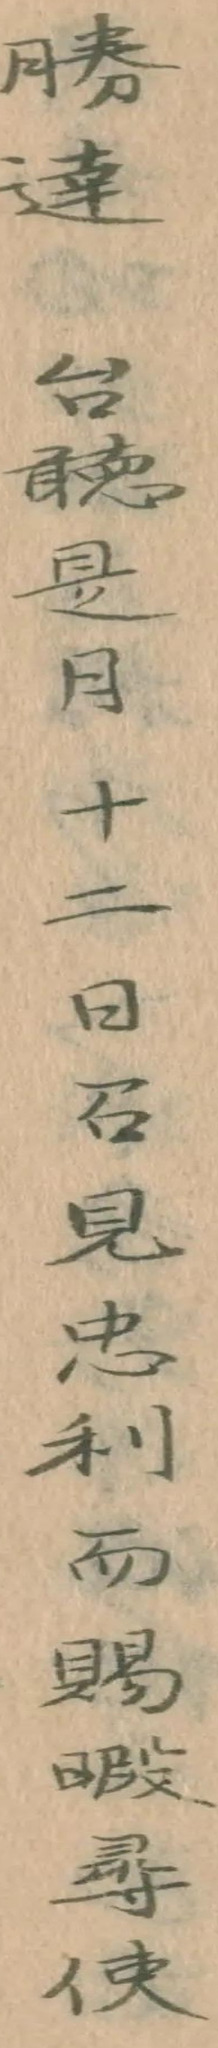勝達台聴是月十二日召見忠利而賜暇尋使
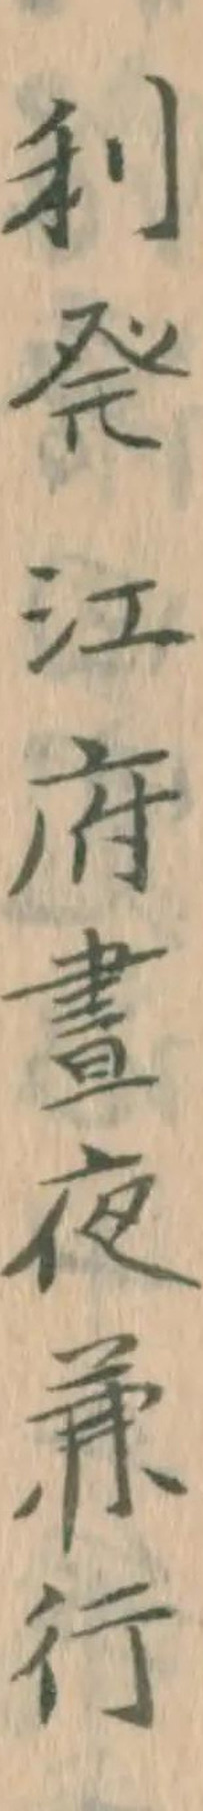利発江府盡夜兼行
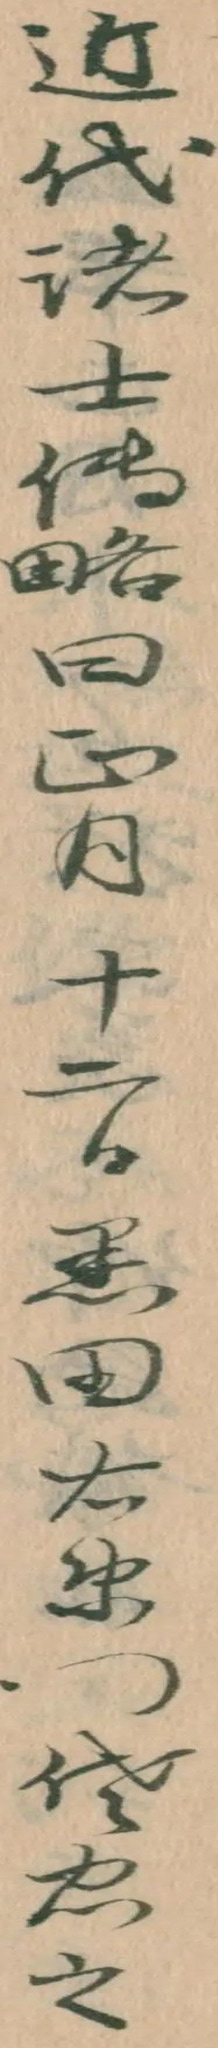近代諸士伝略曰正月十二日黒田右衛門佐忠之
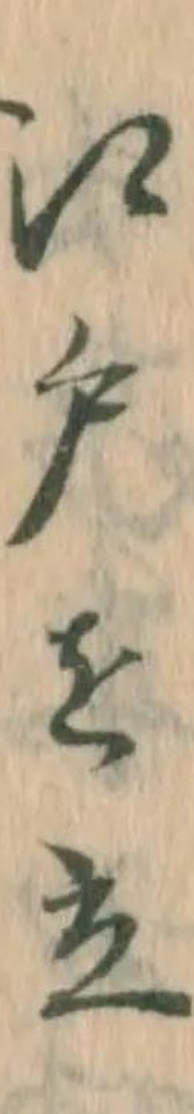江戸を立
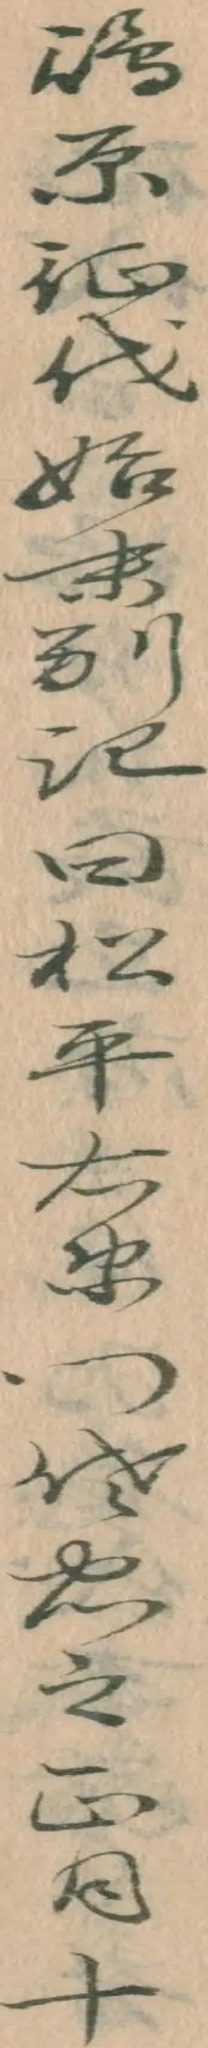島原征伐始末別記曰松平右衛門佐忠之正月十
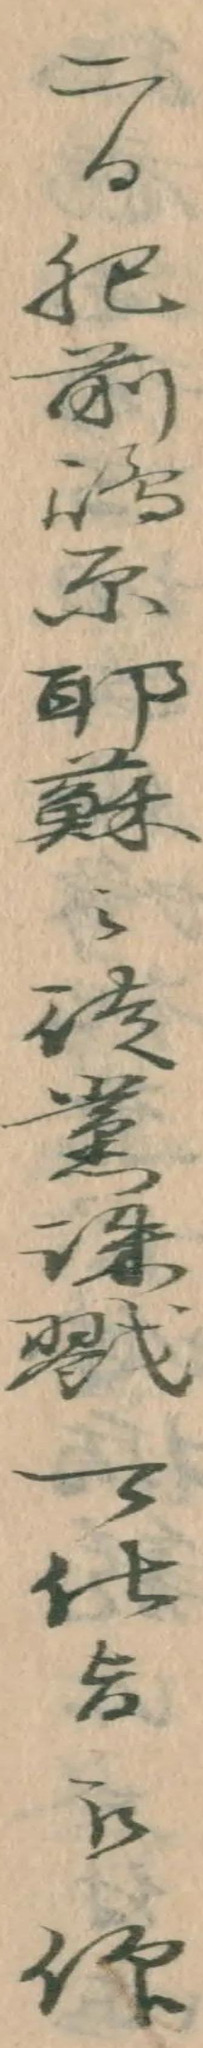二日肥前島原耶蘇之徒党誅戮可仕旨被仰
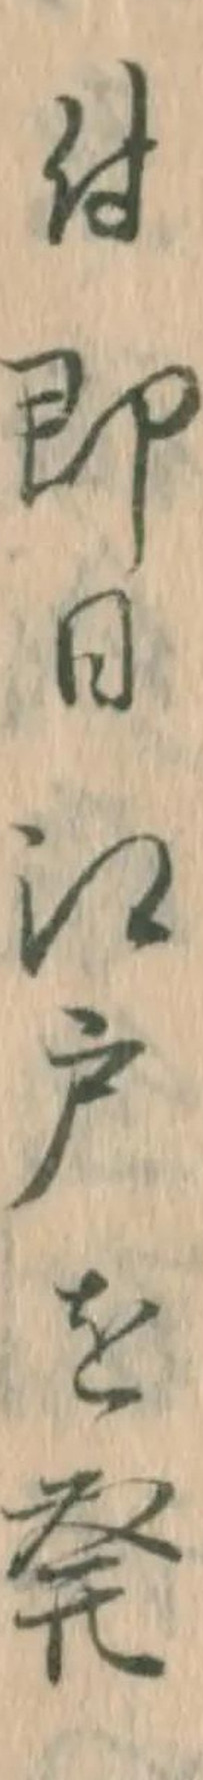付即日江戸を発
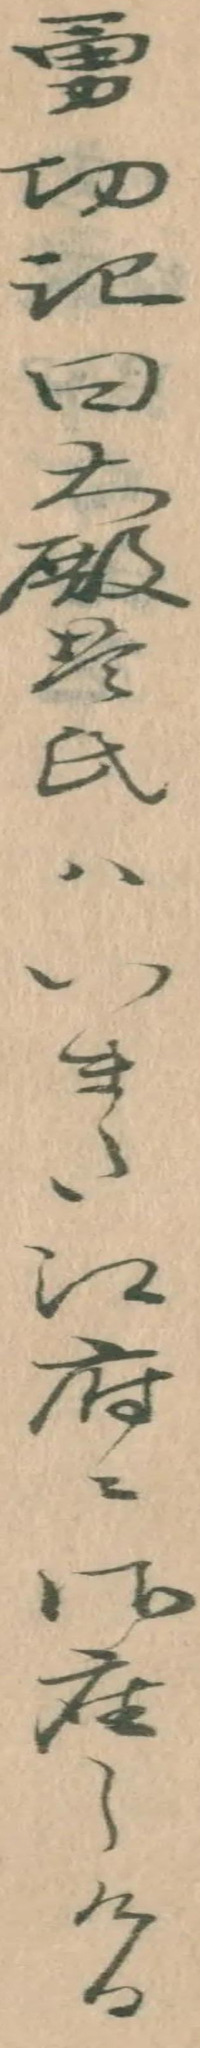勇功記曰大殿豊氏はいまた江府に御座しける
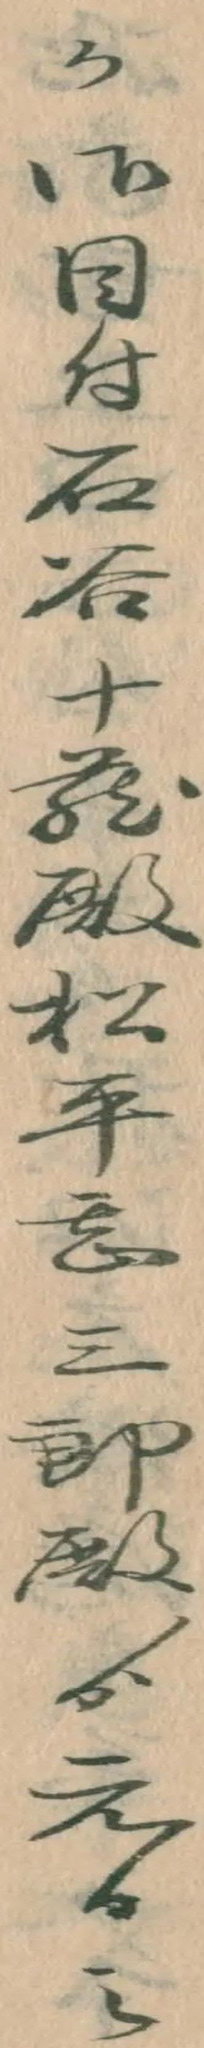か御目付石谷十蔵殿松平甚三郎殿ゟ元日之
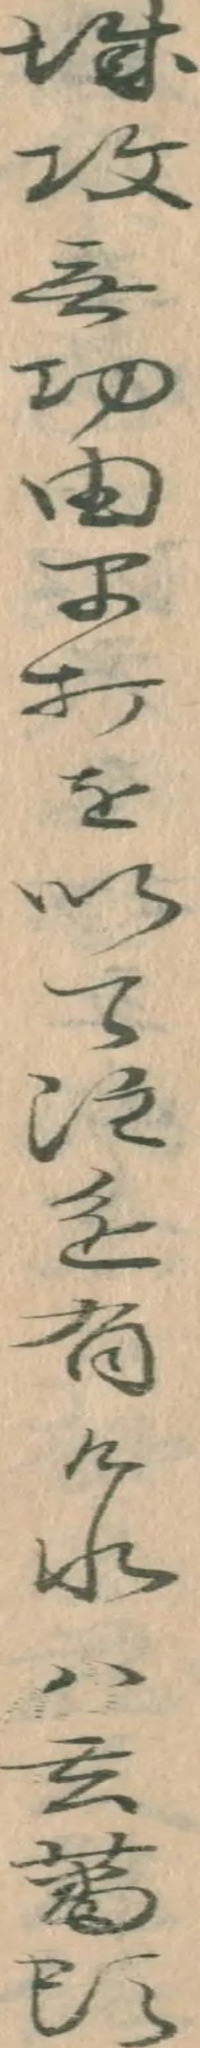城攻無功由早打を以て注進有けれは玄蕃頭
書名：切支丹御退治記 49巻. [6]
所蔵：国立国会図書館 National Diet Library, JAPAN
